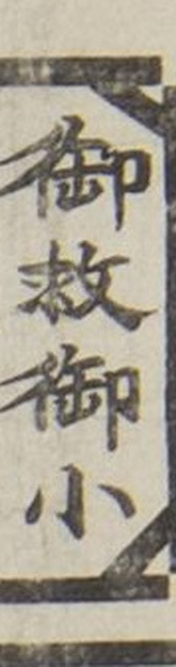御救御小
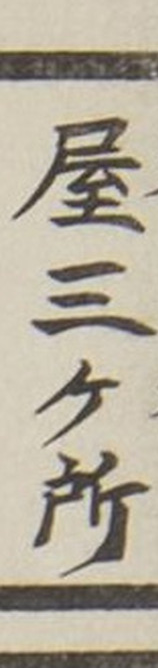屋三ヶ所
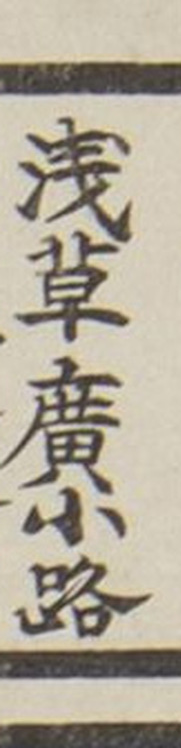浅草広小路
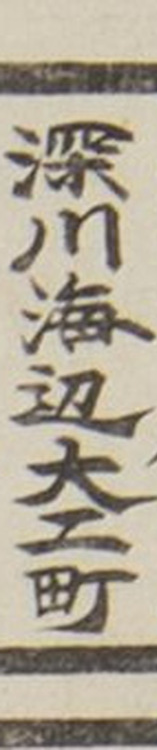深川海辺大工町
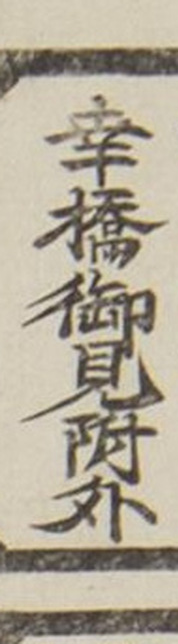幸橋御見附外
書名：関東類焼大地震
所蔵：あいおいニッセイ同和損保株式会社
